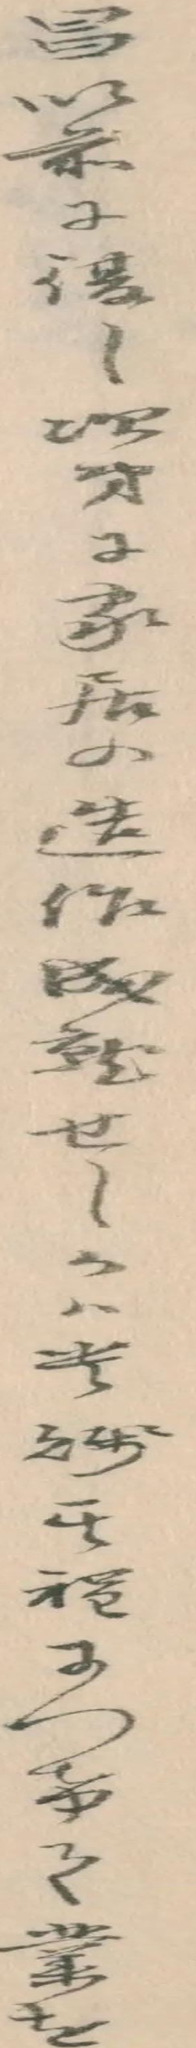昌以前に復し次第に家居の造作成就せしかは貴賤其程につけて業を
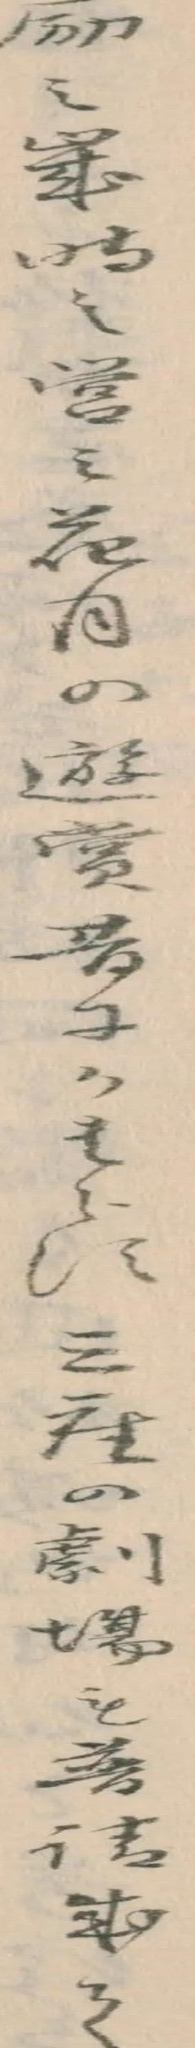励み歳時之営み花月の遊賞昔にかはらす三座の劇場も普請成て
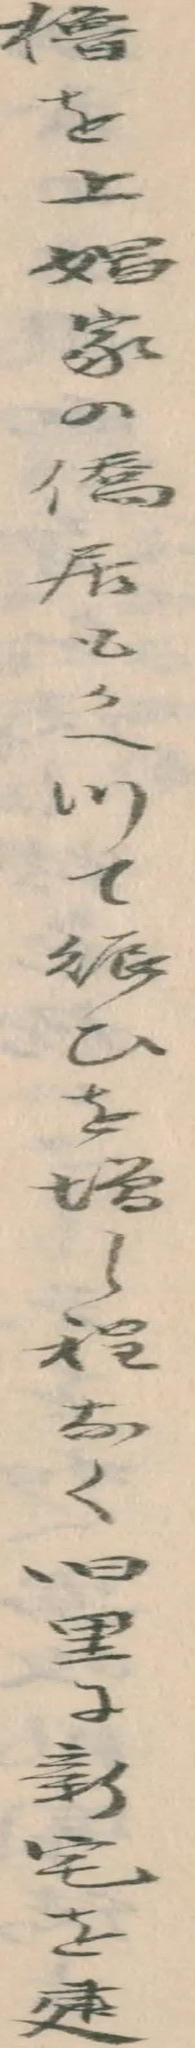櫓を上娼家の僑居もかへつて賑ひを増し程なく旧里に新宅を建
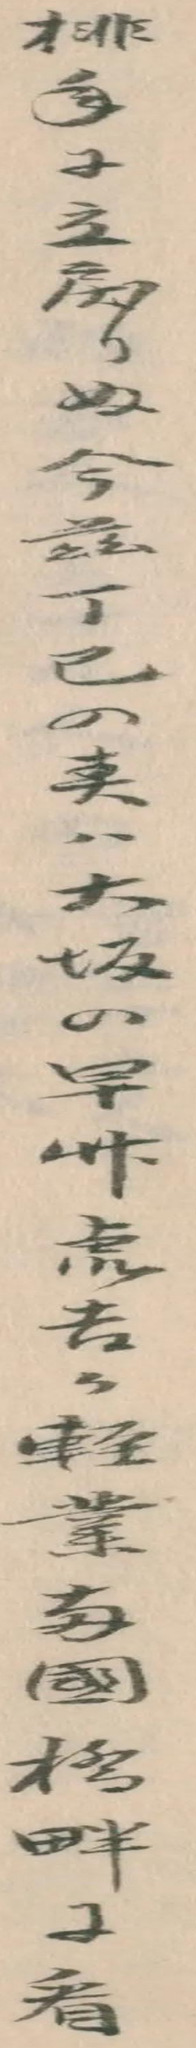排年に立戻りぬ今茲丁巳の春は大坂の早竹虎吉か軽業両国橋畔に看
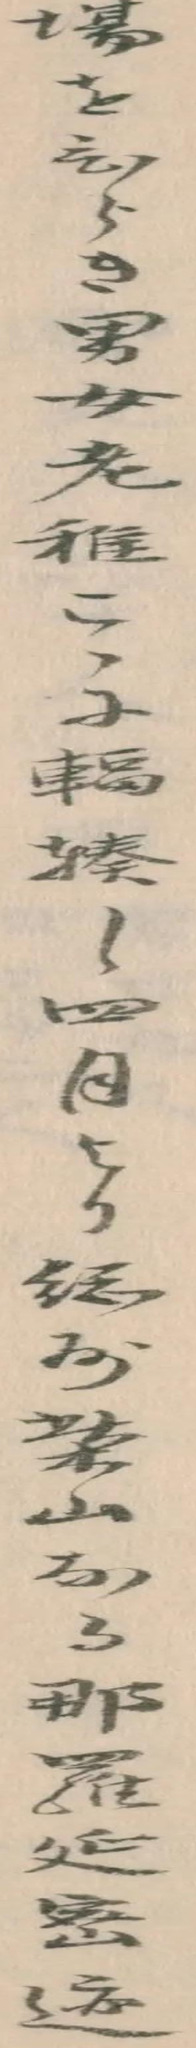場をひらき男女老稚こゝに輻輳し四月より総州柴山なる那羅延密迹
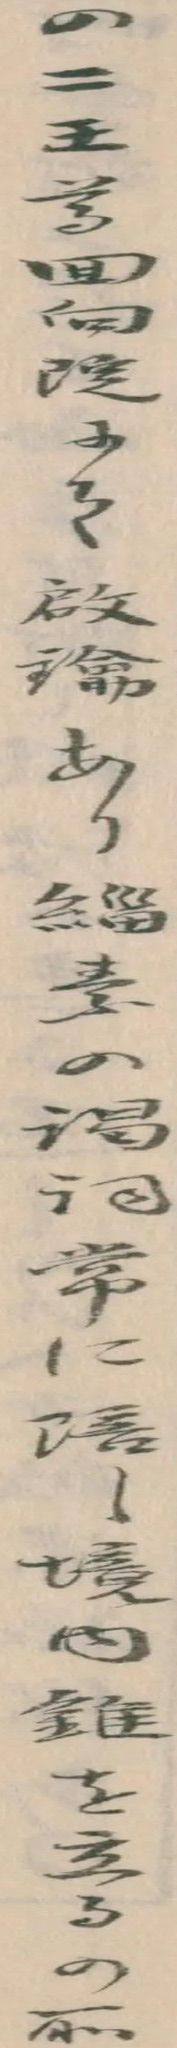の二王尊回向院にて啓鑰あり緇素の謁詞常に陪し境内錐を立るの所
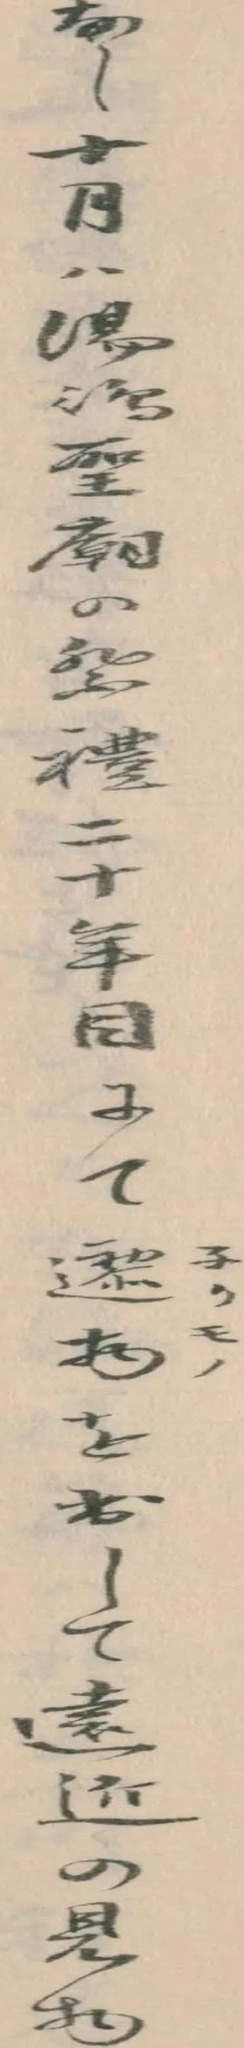なし十月は湯嶋聖廟の祭礼二十年目にて邌物を出して遠近の見物
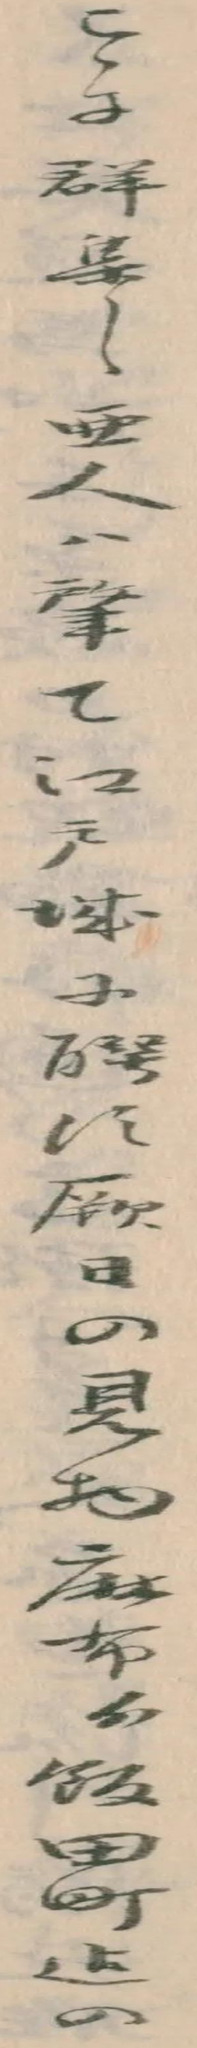こゝに群集し亜人は肇て江戸城に聘す厥日の見物麻布ゟ飯田町迄の
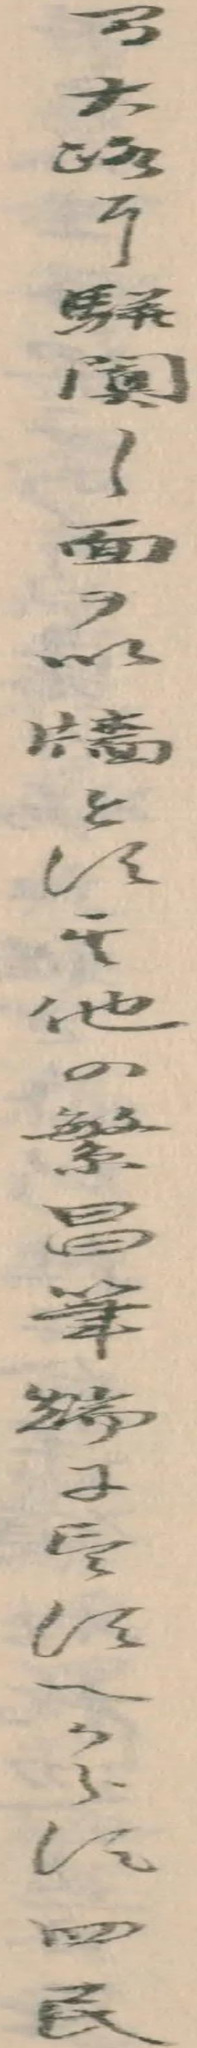間大路に駢闐し面ヲ以牆とす其他の繁昌筆端に尽すへからす四民
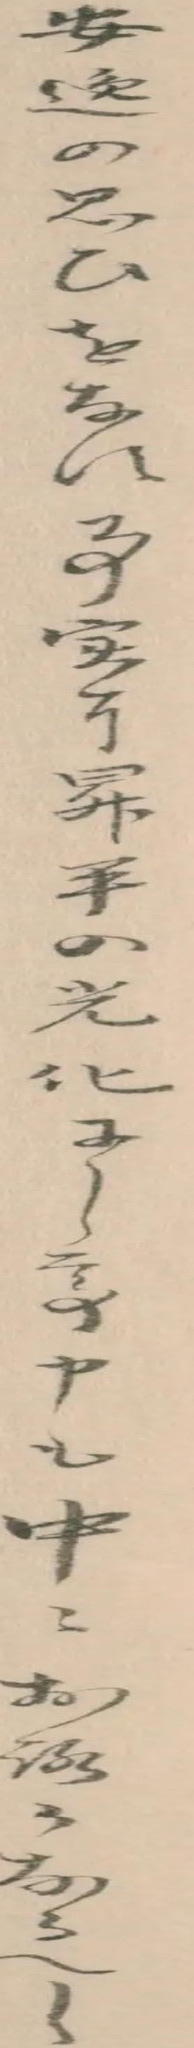安逸の思ひをなす事実に昇平の光化にして申も中々おろかなるへし

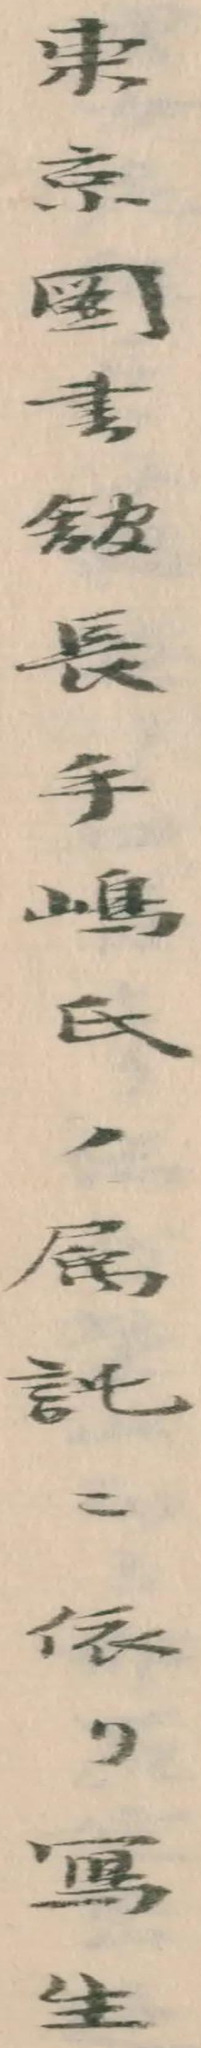東京図書館長手嶋氏ノ嘱託ニ依リ写生
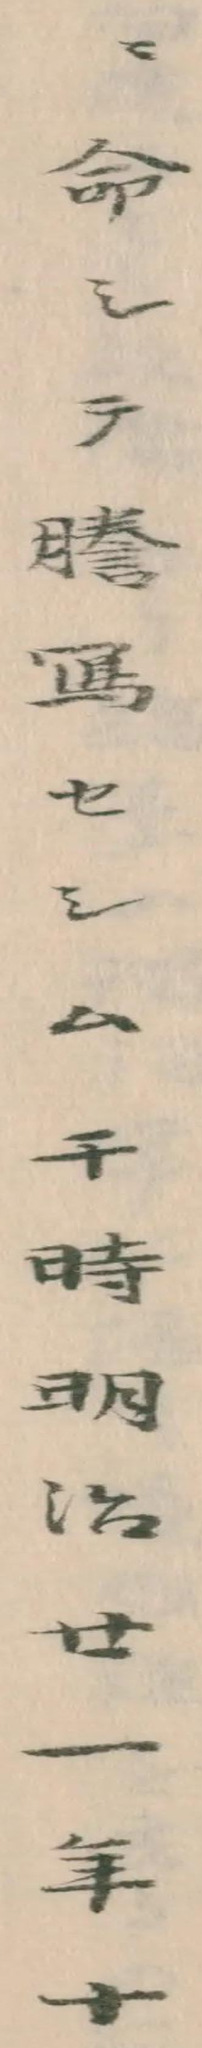ニ命シテ謄写セシム于時明治廿一年十
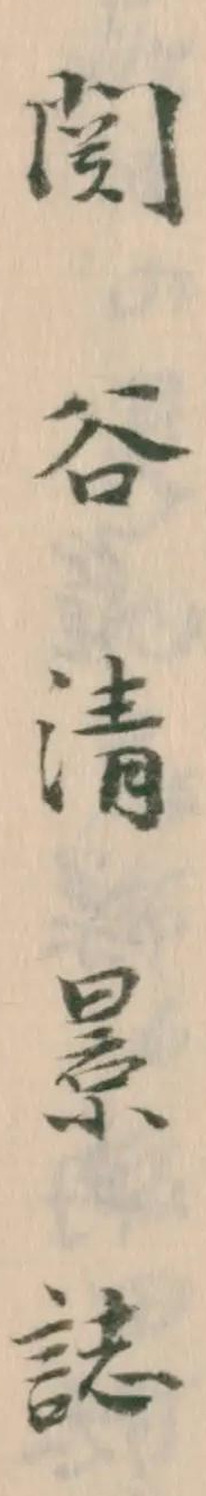関谷清景誌
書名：地災撮要. 巻10(地震之部) 上,下
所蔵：国立国会図書館 National Diet Library, JAPAN
